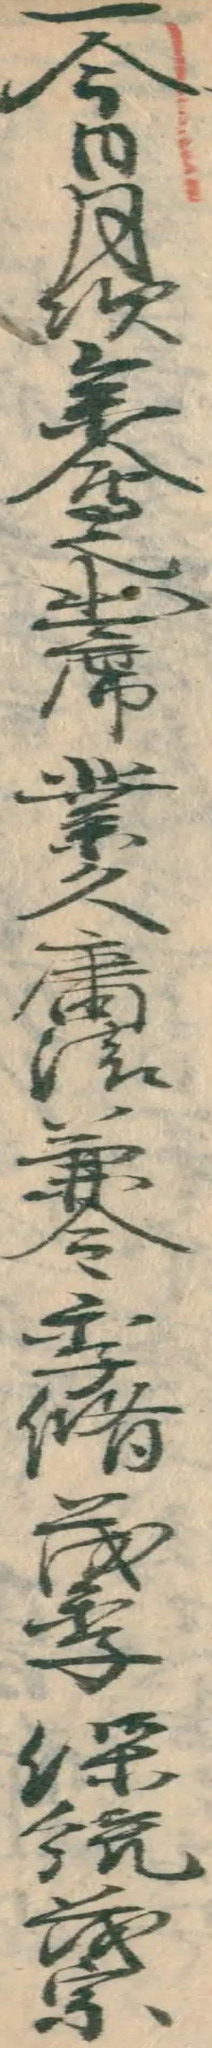一今日月次参会也出席業久庸清兼令季脩茂季保統茂宗
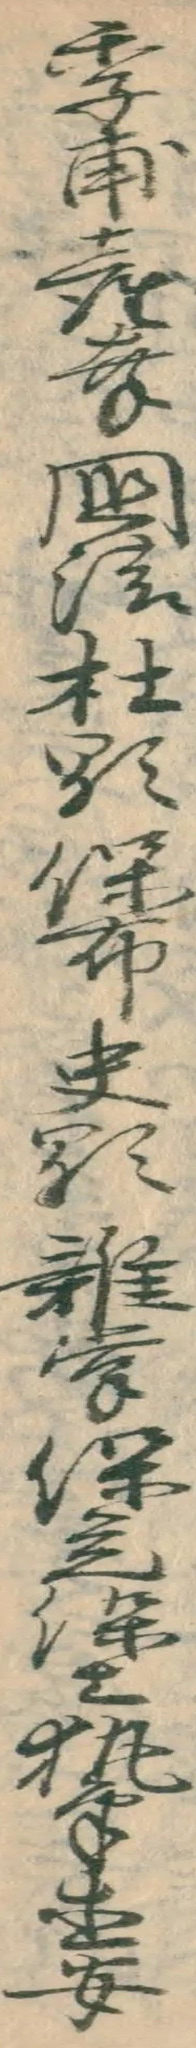季甫産幸国清杜顕保布史顕雑掌保覚保土執筆直安

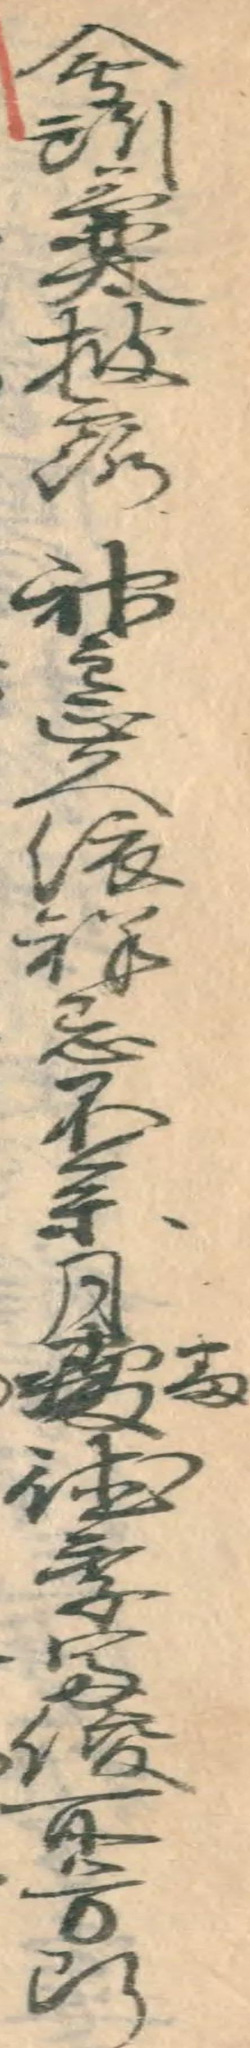会所兼太披露神主正久依祥忌不参月番徳季富俊所労断
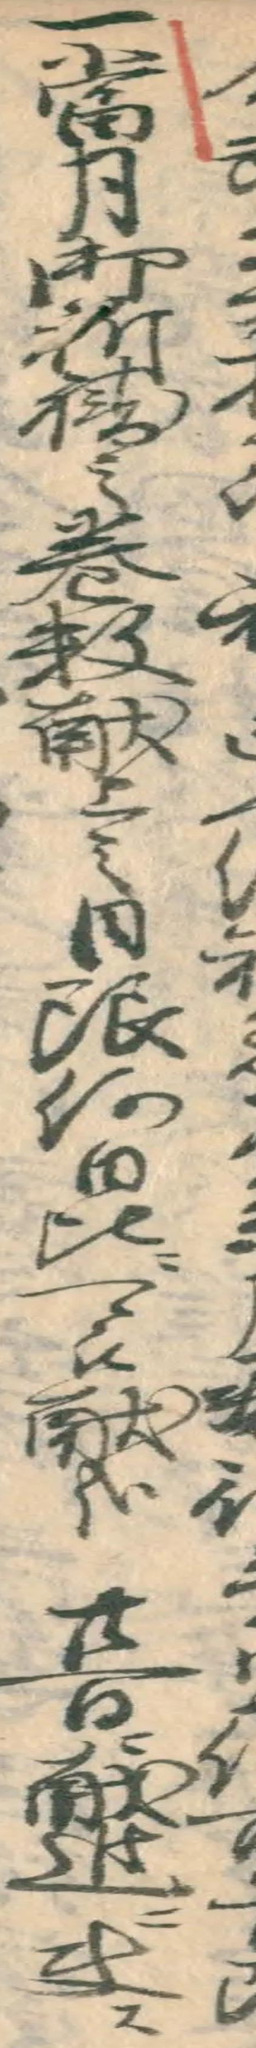一当月御祈祷之巻数献上之日限何日比ニ可被献哉廿一日ニ献進ニ決ス
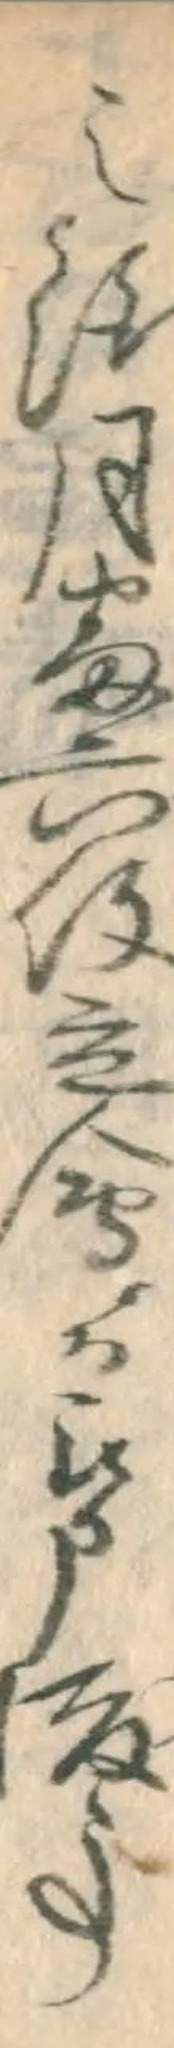之趣月番六役立会ニ而被申渡候事
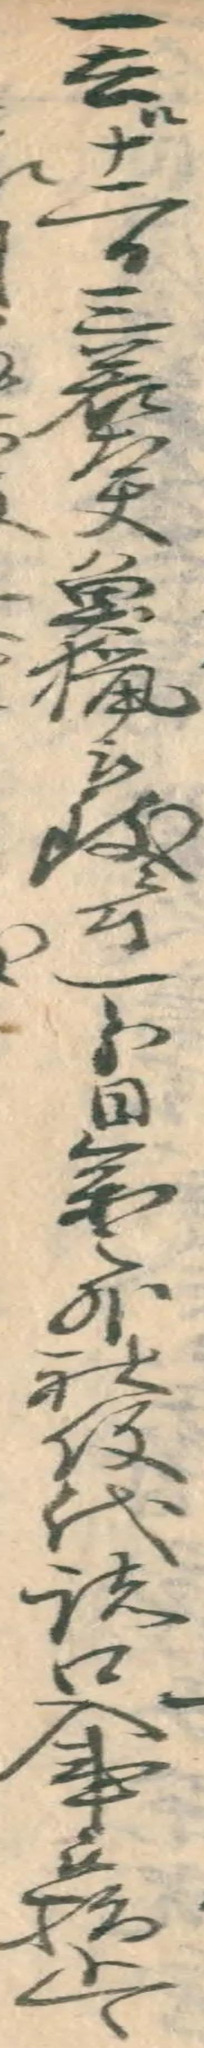一去ル十二日三若大夫魚猟被致ニ付一分日参之外社役代諸口入事被指止候
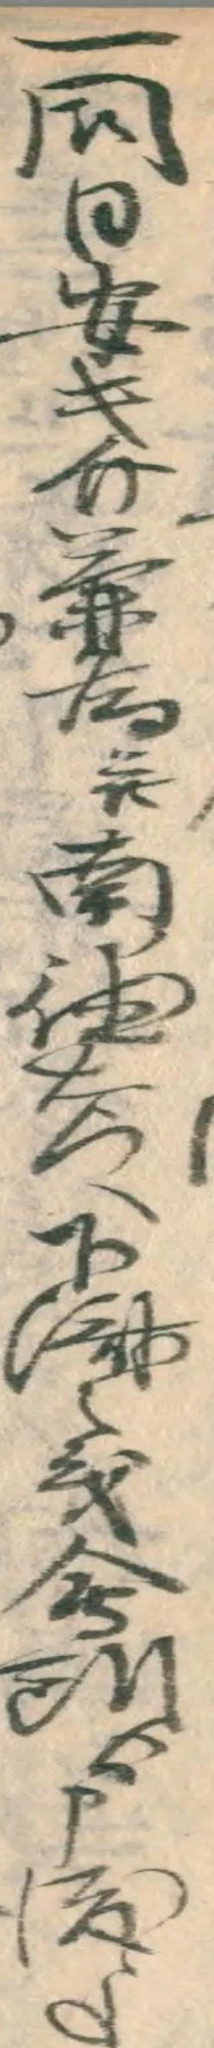一同日安キ介兼為并南ノ徳右衛門へ下済之義会所ゟ申渡候事
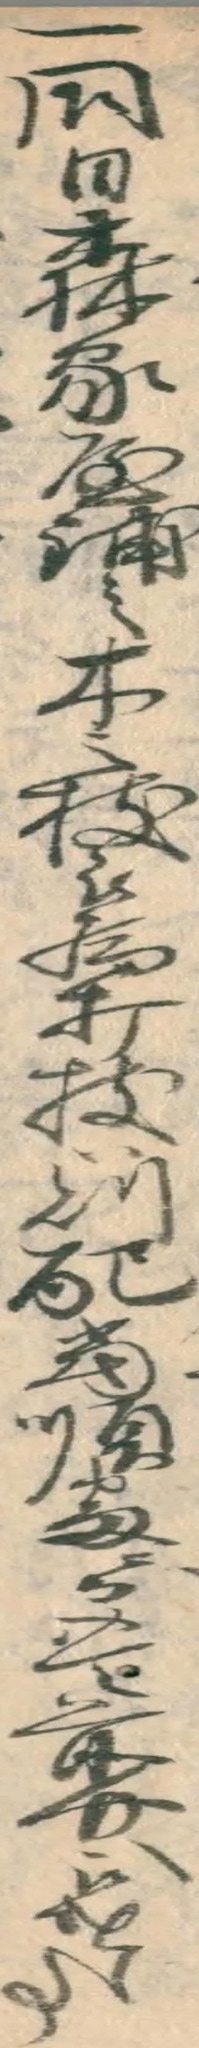一同日森家屋鋪之木之枝被為打枝ハ則配当順番ニ而豊前介へ被遣候事
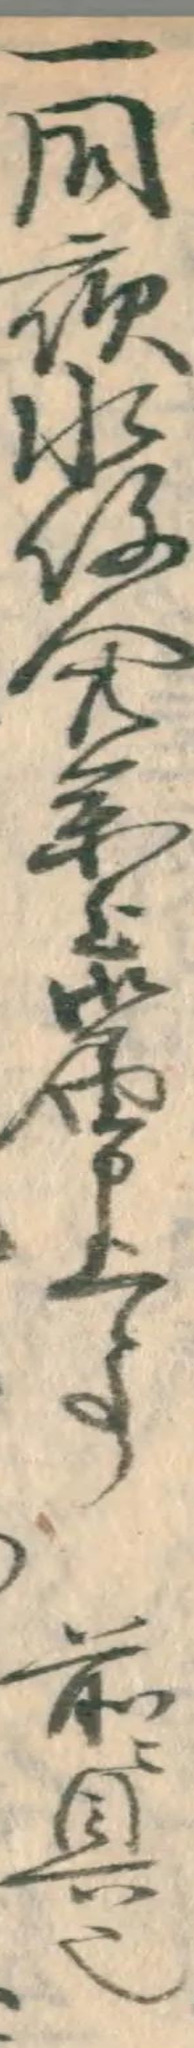一同夜水役人共参上御届申上候事前々具也
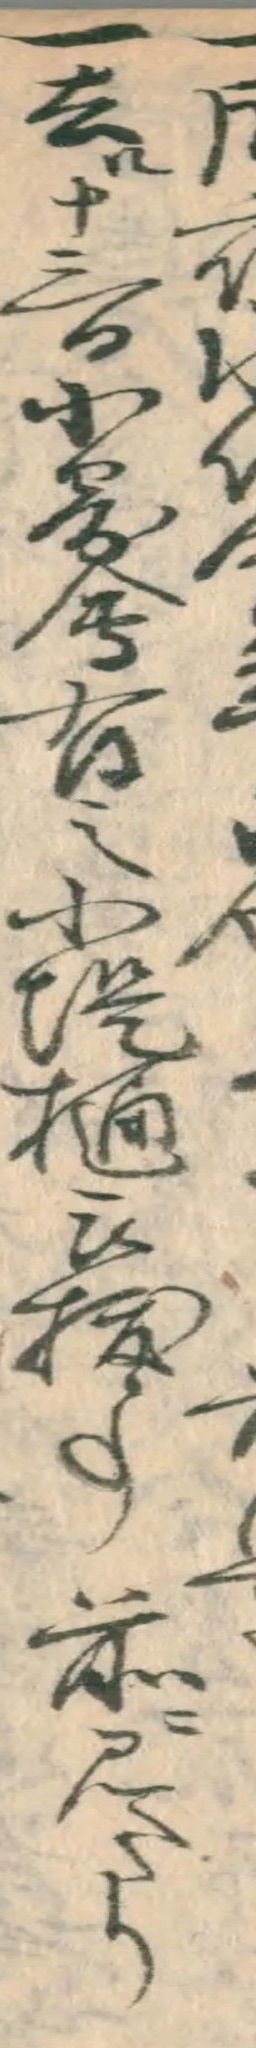一去ル十三日小寄会有之小堤樋被抜候事前見へたり
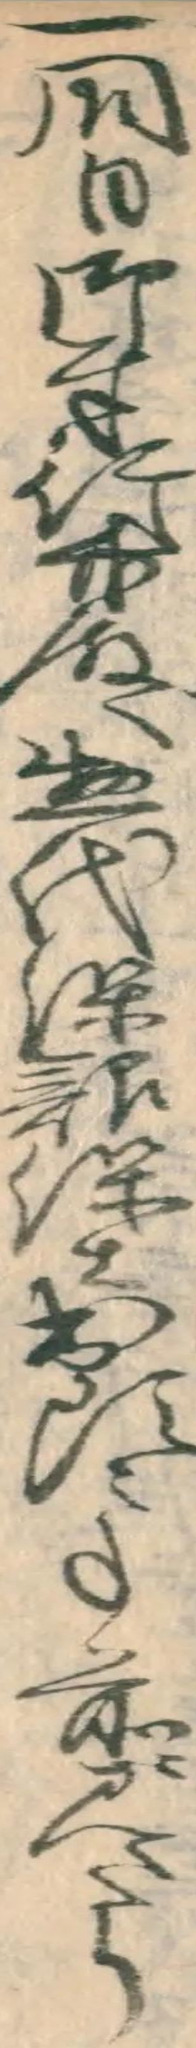一同日御奉行弁殿へ惣代保韶保土出頭之事前ニ見へたり
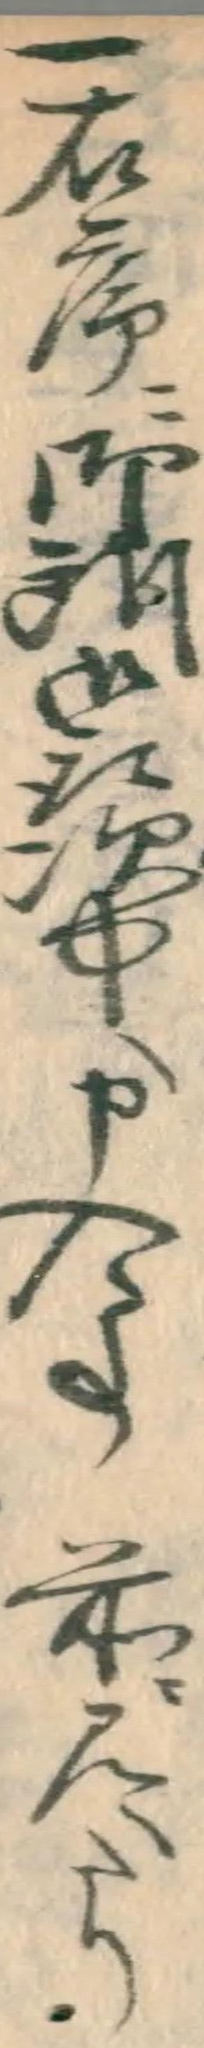一右序ニ御所御取次中へ申入候事前ニ見へたり
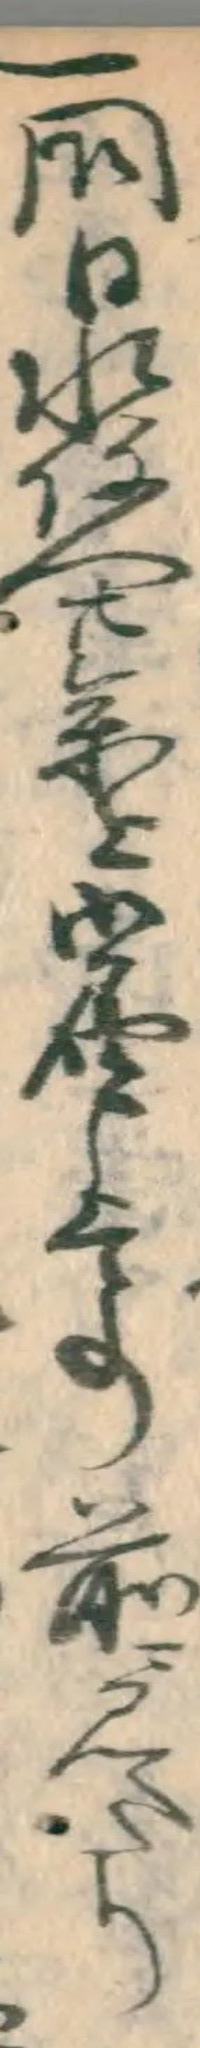一同日水役人共参上御届申上候事前ニ見へたり
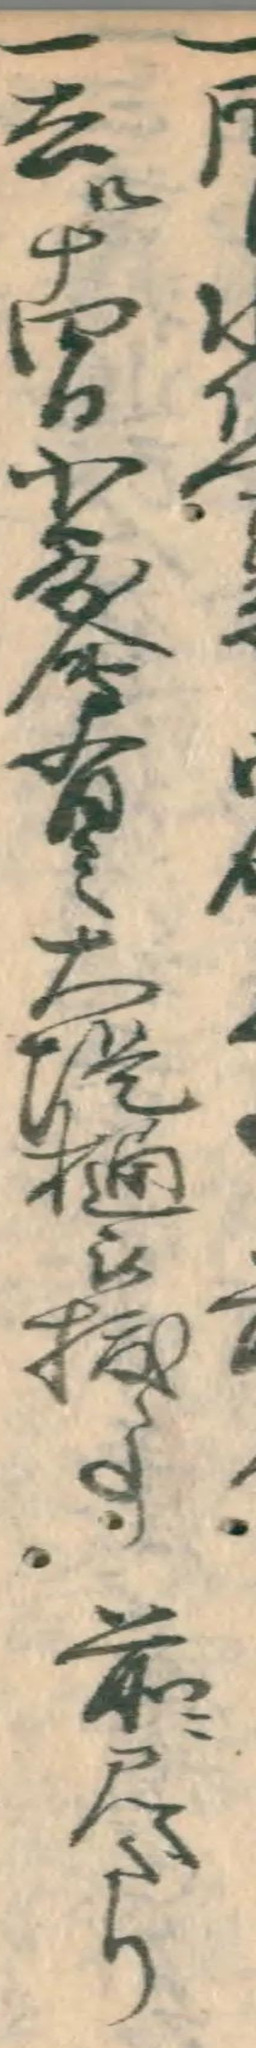一去ル十四日小寄会有之大堤樋被抜候事前ニ見へたり
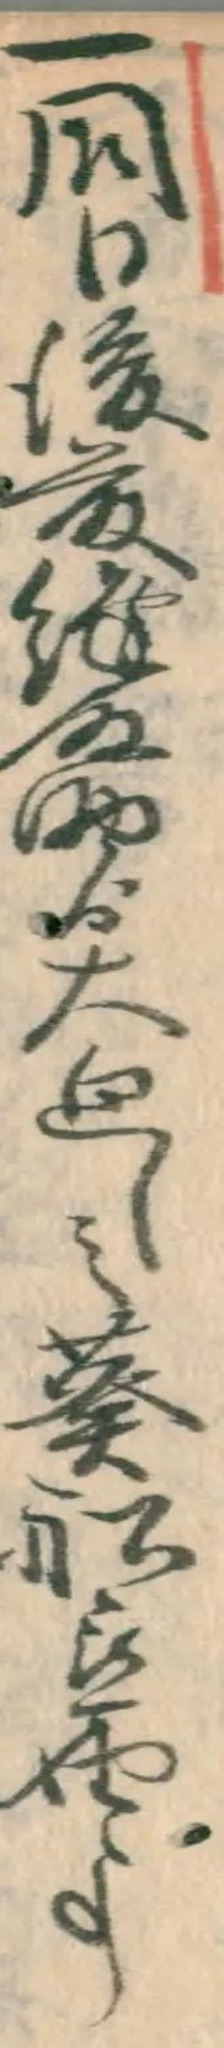一同日後藤縫殿助ゟ大廻し之葵船被届候事
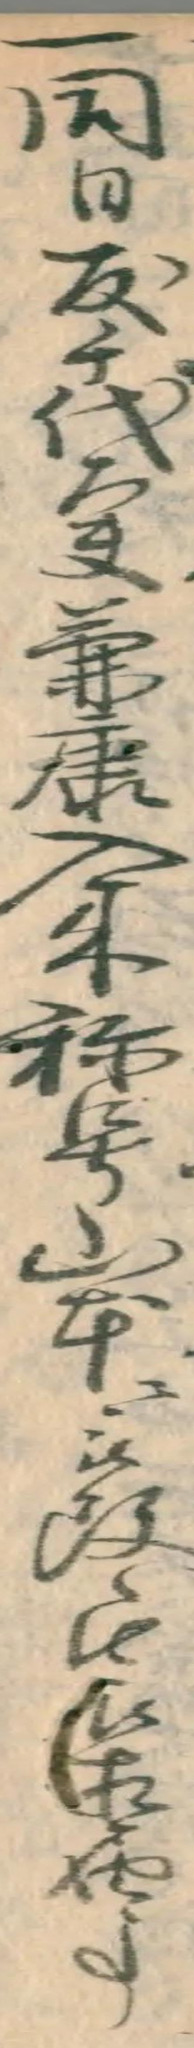一同日友千代大夫兼康入来称号山本ニ被改候由被相届候事
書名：賀茂社記録. 第58冊
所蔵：国立国会図書館 National Diet Library, JAPAN
